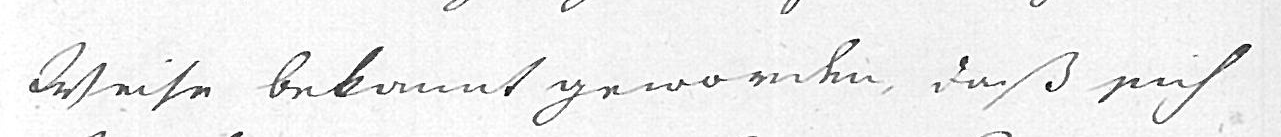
Weise bekannt geworden, daß sich
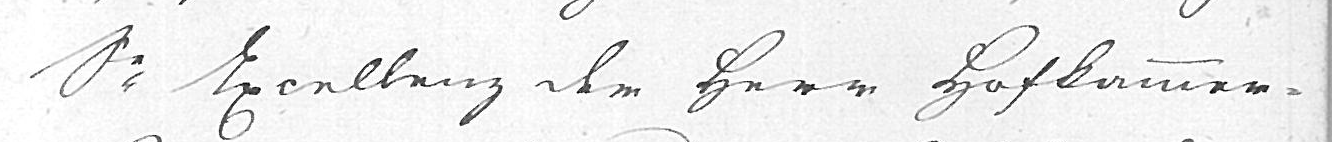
Sr. Excellenz der Herr Hofkammer-
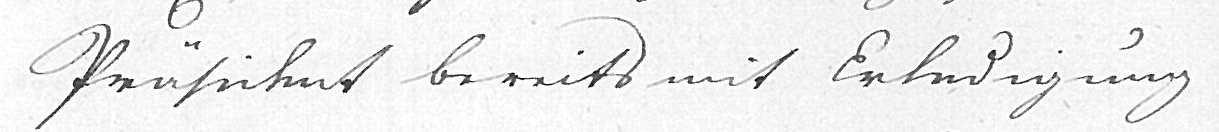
Präsident bereits mit Erledigung
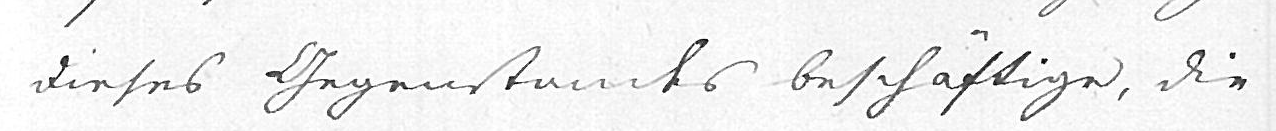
diese Gegenstands beschäftige, die
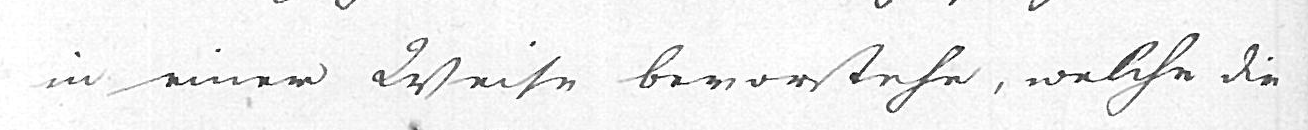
in einer Weise bevorstehe, welche die
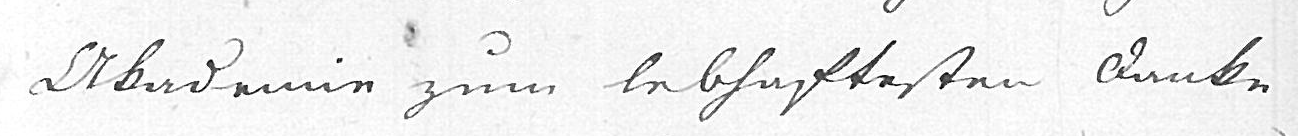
Akademie zum lebhaftesten Dank
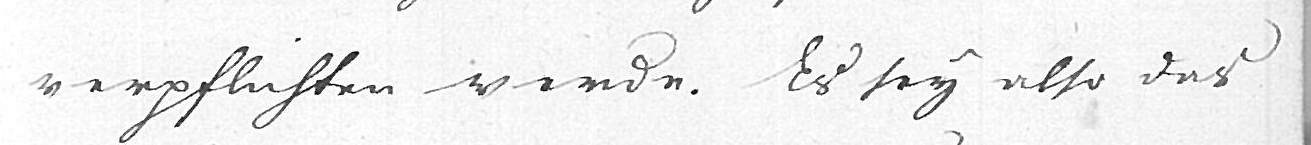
verpflichten werde. Es sey also das
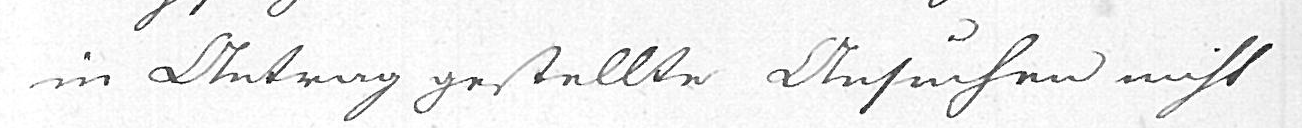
im Antrag gestellte Ansuchen nicht
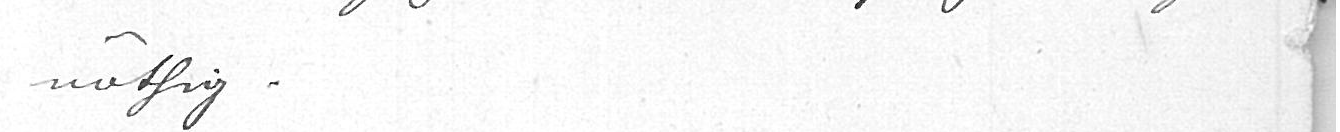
nöthig.
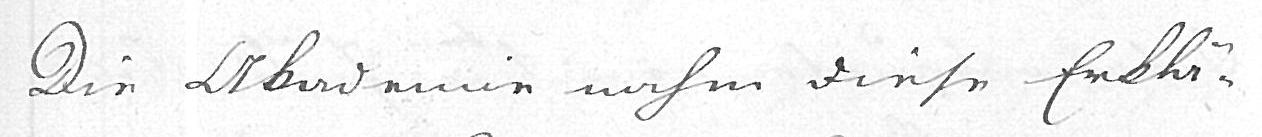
Die Akademie nahm diese Erklä-
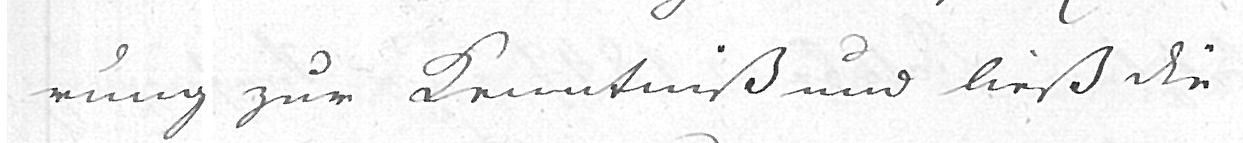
rung zur Kenntniß und ließ die
